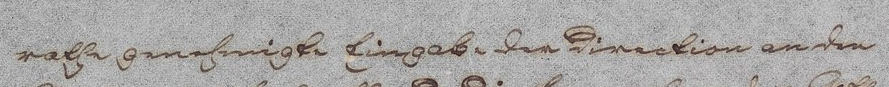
rathe genehmigte Eingabe der Direction an den
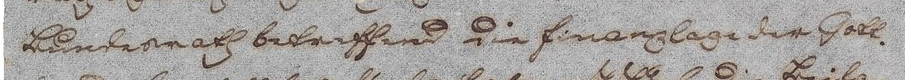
Bundesrath betreffend die Finanzlage der Gott-
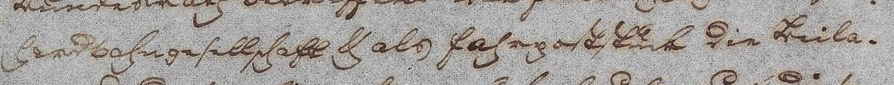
hardbahngesellschaft & als Fahrpoststücke die Beila-
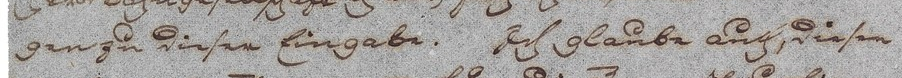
gen zu dieser Eingabe. Ich glaube auch, diesen
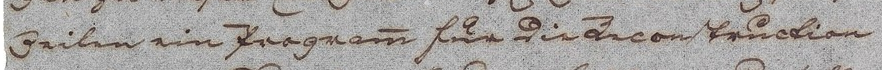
Zeilen ein Programm für die Reconstruction
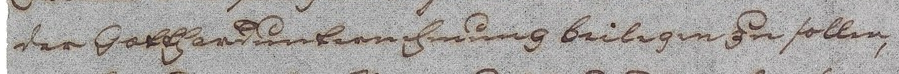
der Gotthardunternehmung beilegen zu sollen,
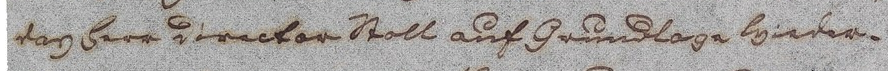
das Herr Director Stoll auf Grundlage wieder-
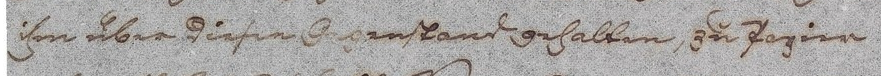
ihm über diesen Gegenstand gehalten, zu Papier
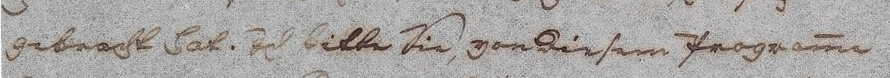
gebracht hat. Ich bitte Sie, von diesem Programme
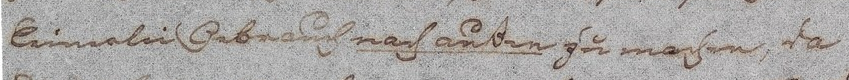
keinerlei Gebrauch nach außen zu machen, da
